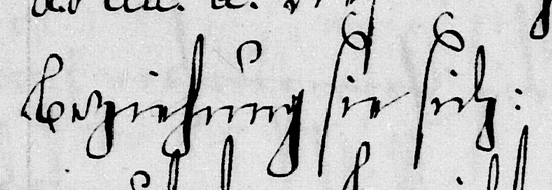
Beziehung sie sich:
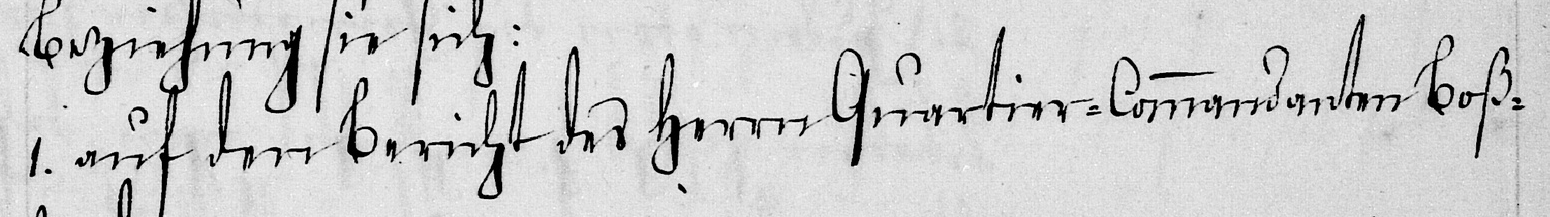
1. auf den Bericht des Herrn Quartier-Commandanten Boß¬
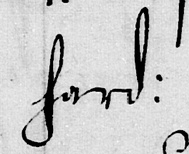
hard:
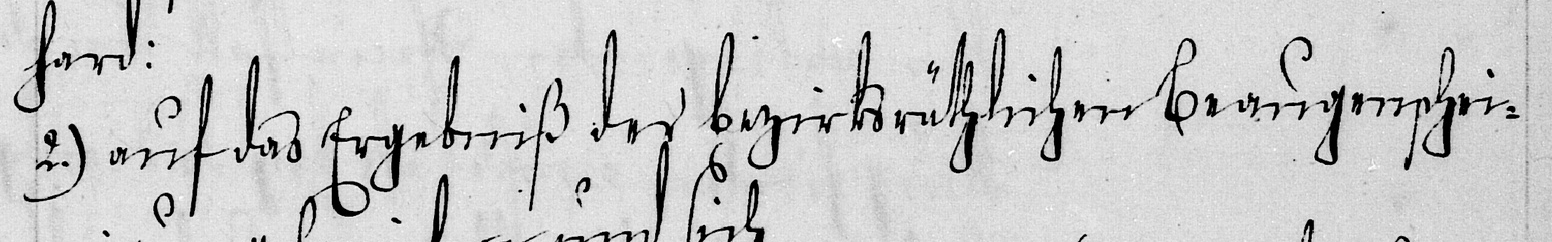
2.) auf das Ergebniß der bezirksräthlichen Beaugenschei¬
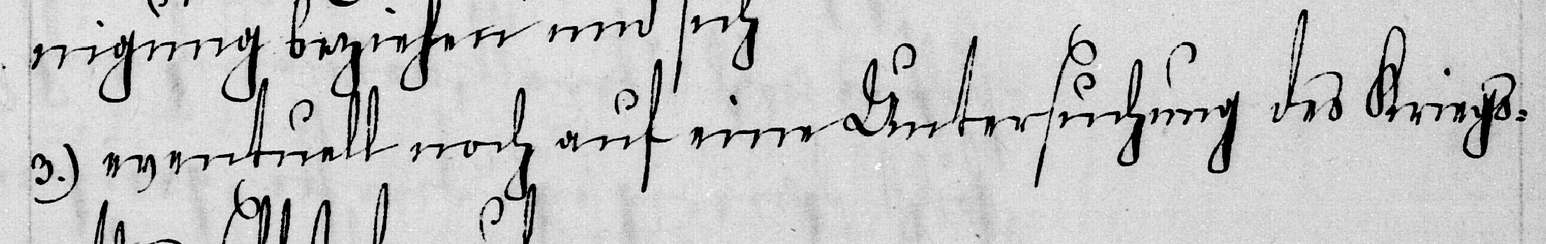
3.) eventuell noch auf eine Untersuchung des Kriegs¬
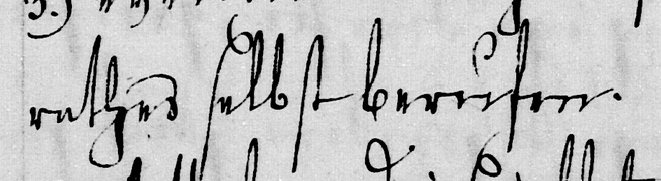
rathes selbst berufen.
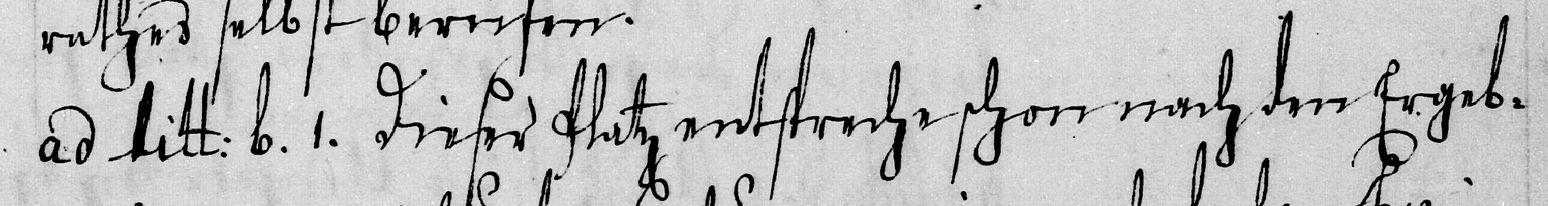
b. 1. Dieser Platz entspreche schon nach den Ergeb¬
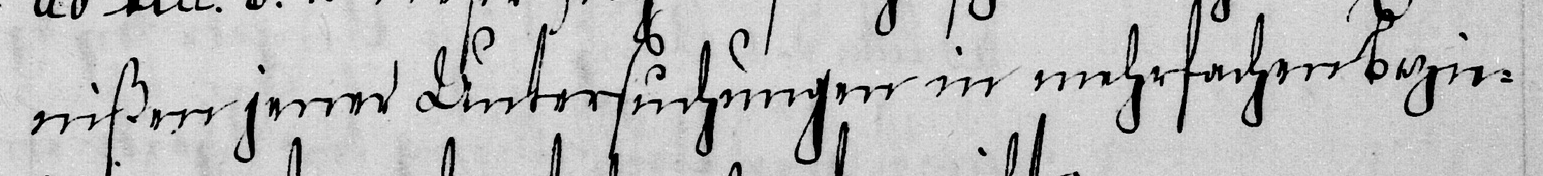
nißen jener Untersuchungen in mehrfachen Bezie¬
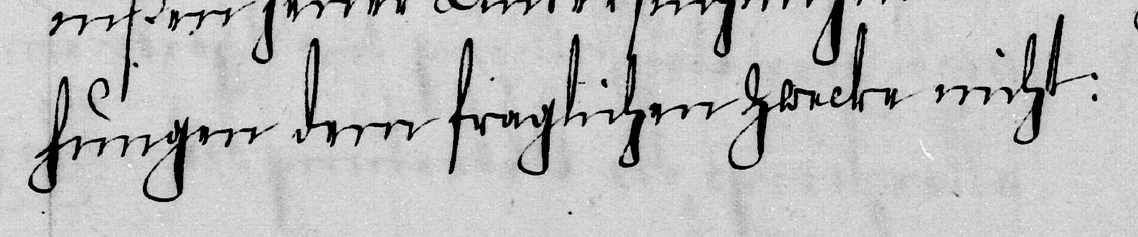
hungen dem fraglichen Zwecken nicht:
